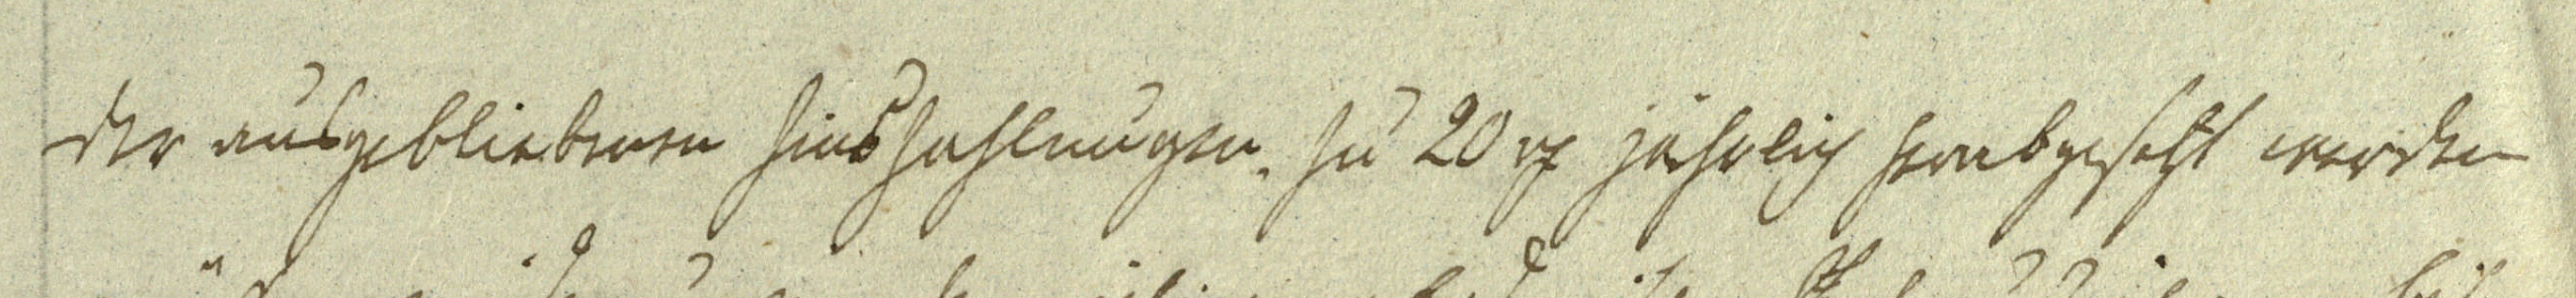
der ausgebliebenen Zinszahlungen. zu 20 rf. jährlich herabgesetzt werden
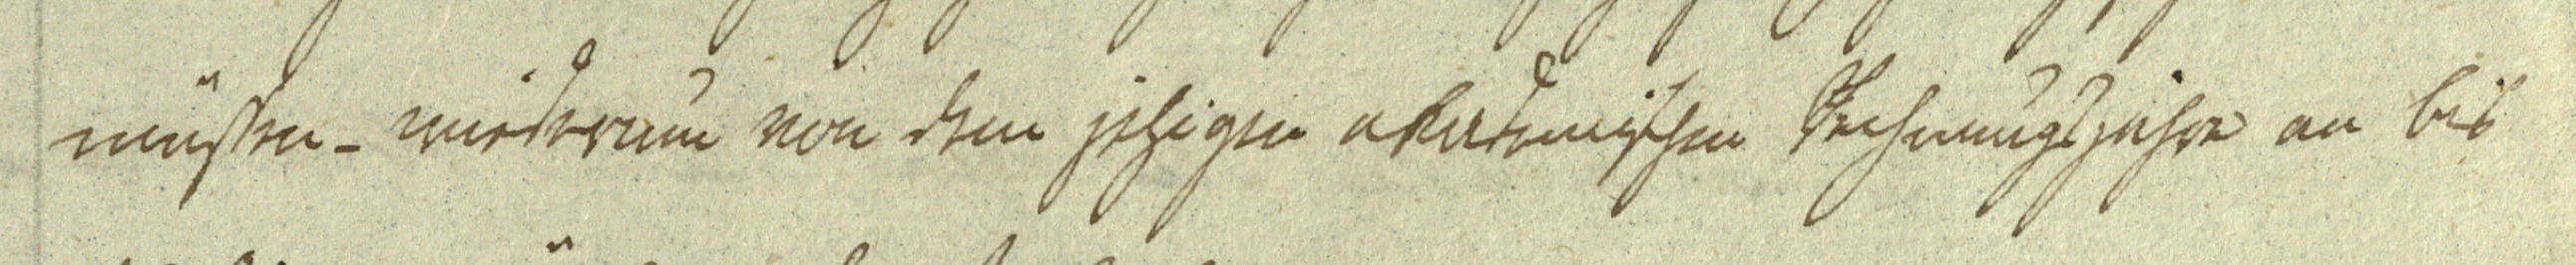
müssen. wiederum von dem jetzigen akademischen Rechnungsjahre an bis
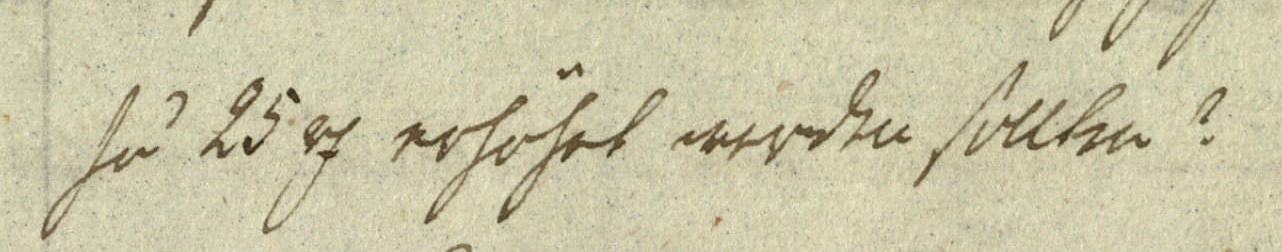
zu 25 rf erhöhet werden sollten?
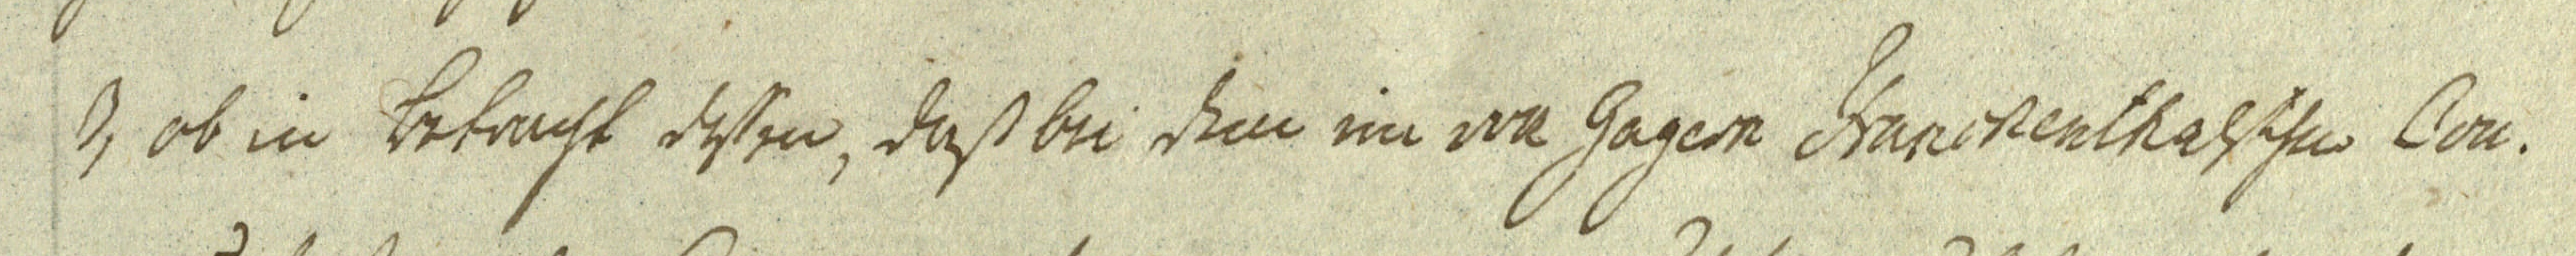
3, ob in Betracht dessen, daß bei dem im von Gagern Franckenthalschen Con¬
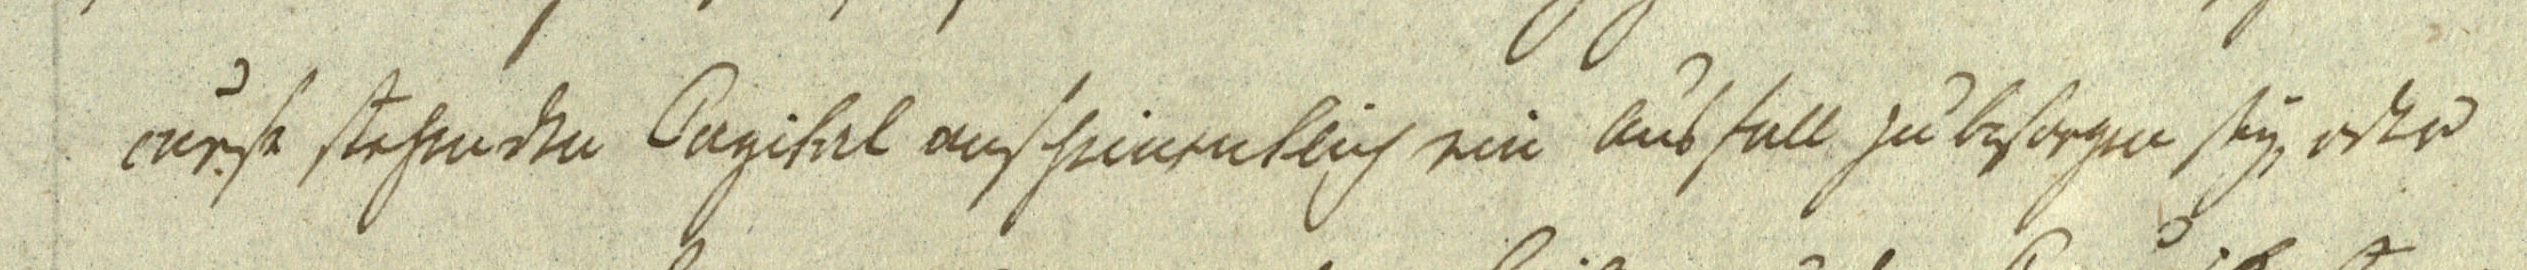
curse stehenden Capital anscheinentlich ein Ausfall zu besorgen seÿ, oder
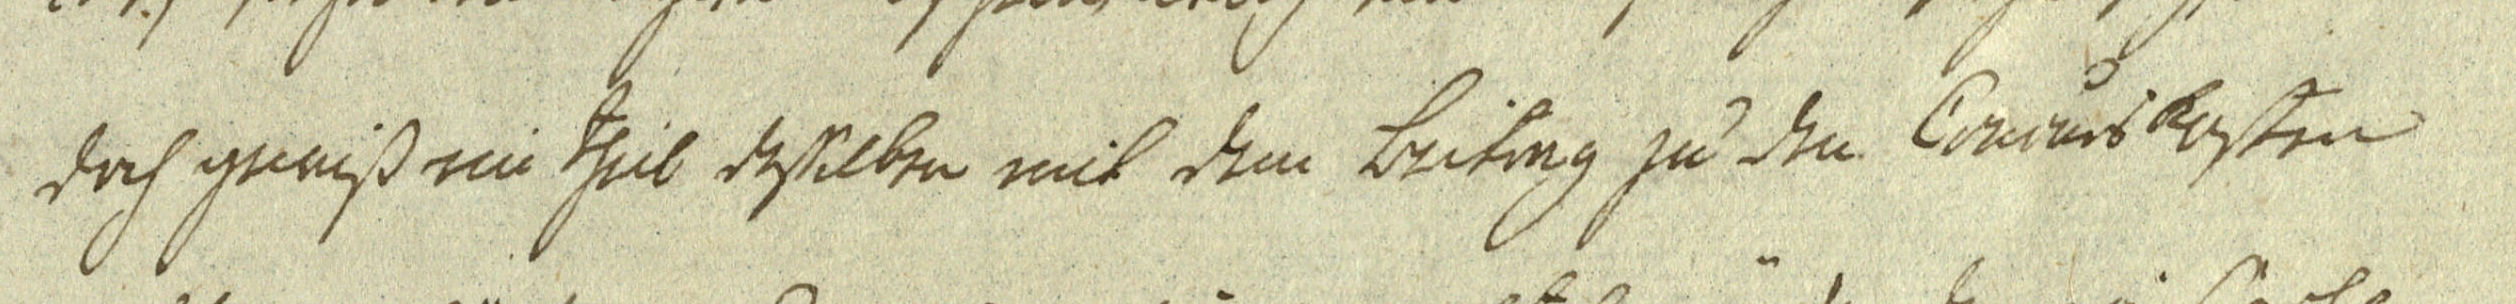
doch gewiß ein Theil desselben mit dem Beitrag zu den Concurskosten
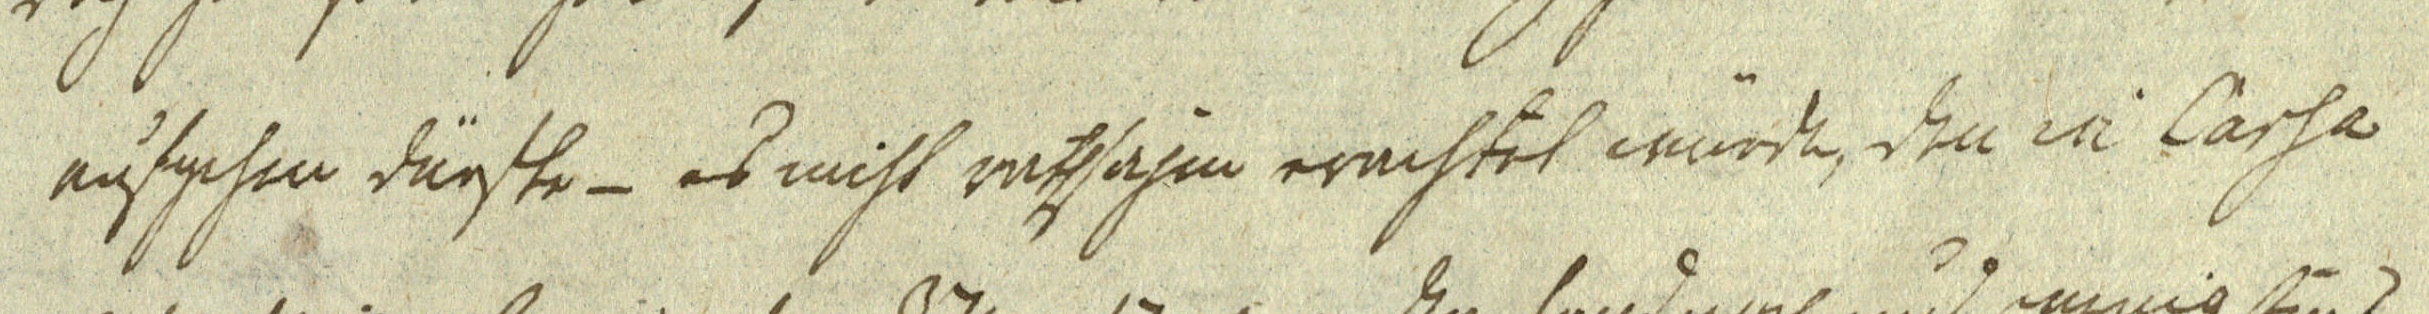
aufgehen dürfte - es nicht rathsahm erachtet würde, den in Cassa
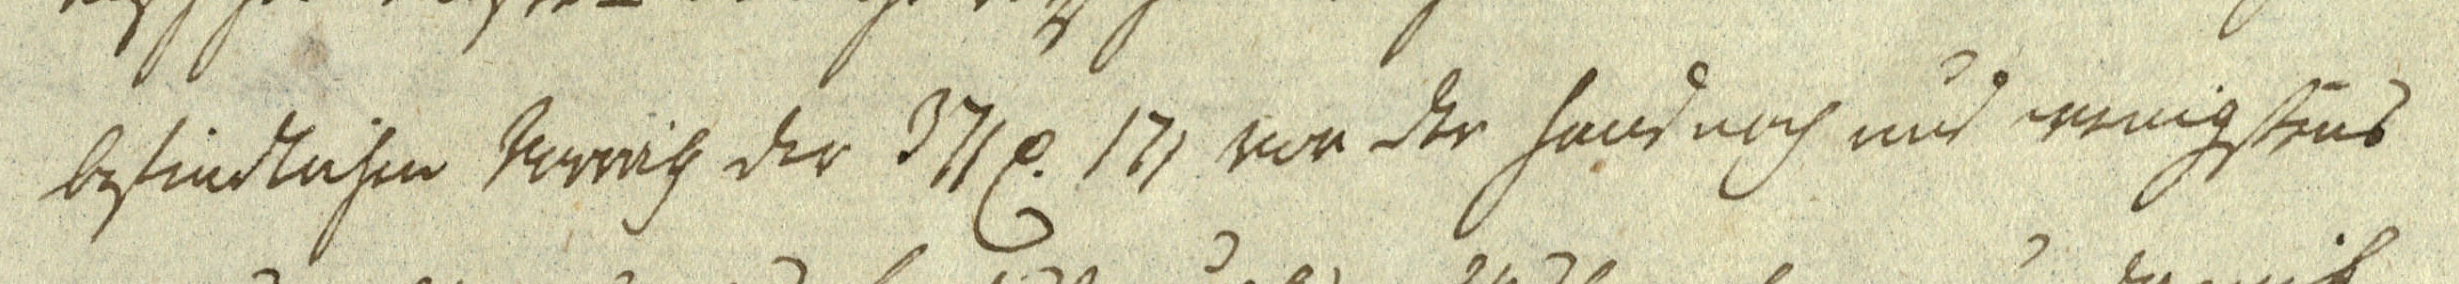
befindlichen Vorrath der 371 l. 17, vor der Hand noch und wenigstens
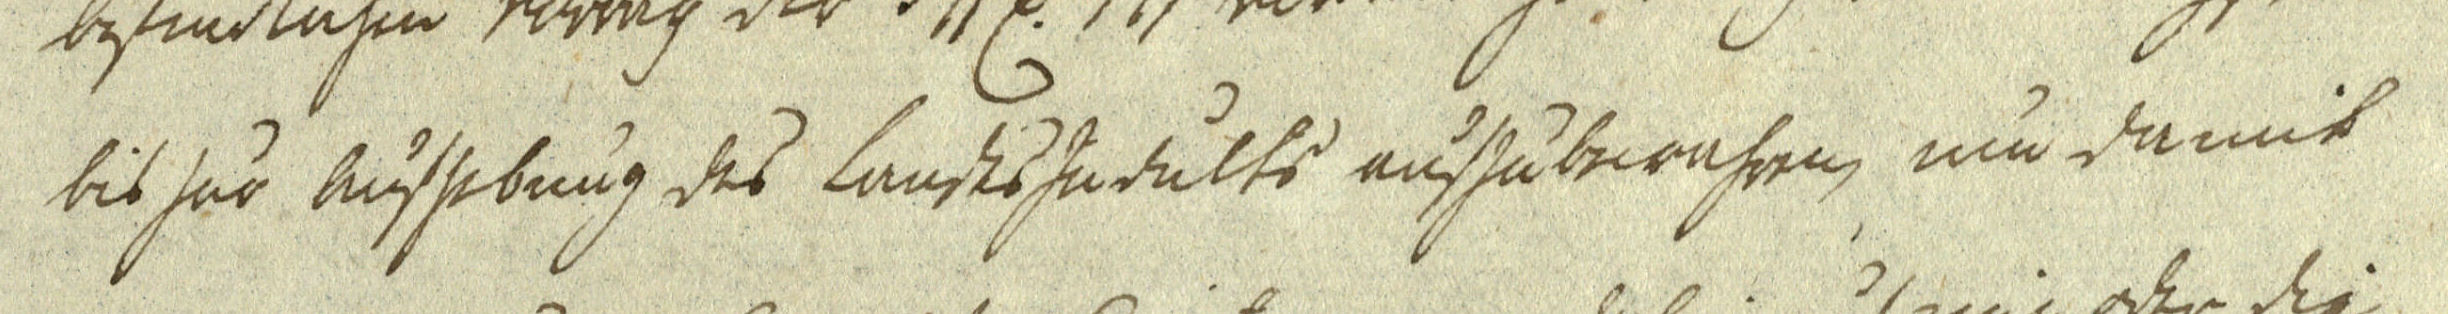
bis zur Aufhebung des LandesIndults auzubewahren, um damit
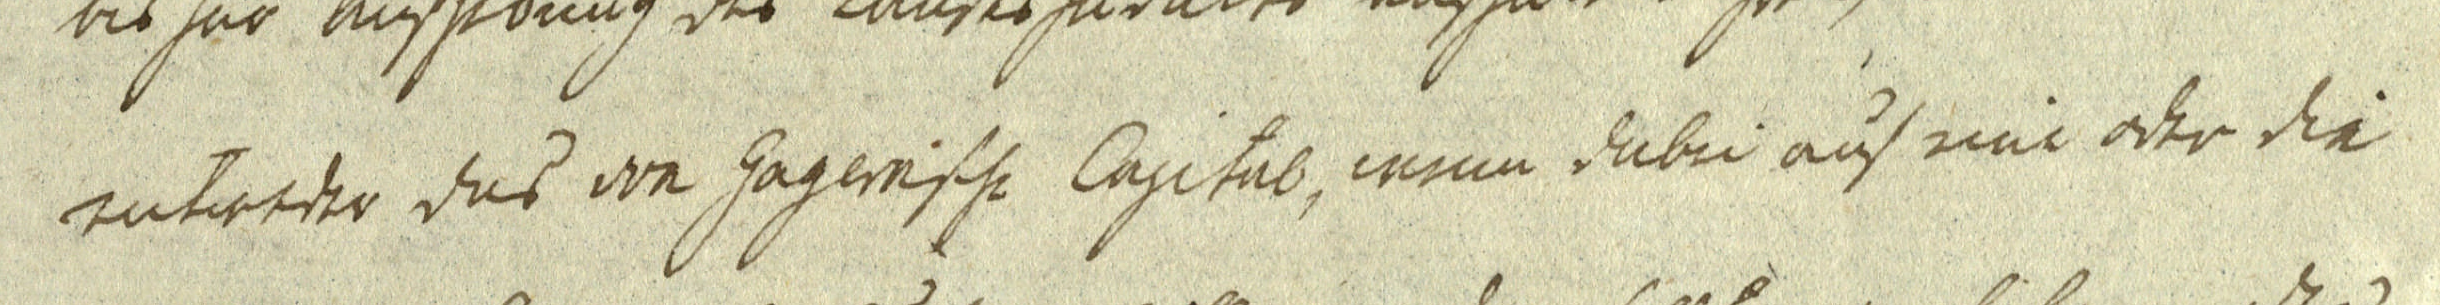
entweder das dem Gagerische Capital, wenn dabei auf eine oder die
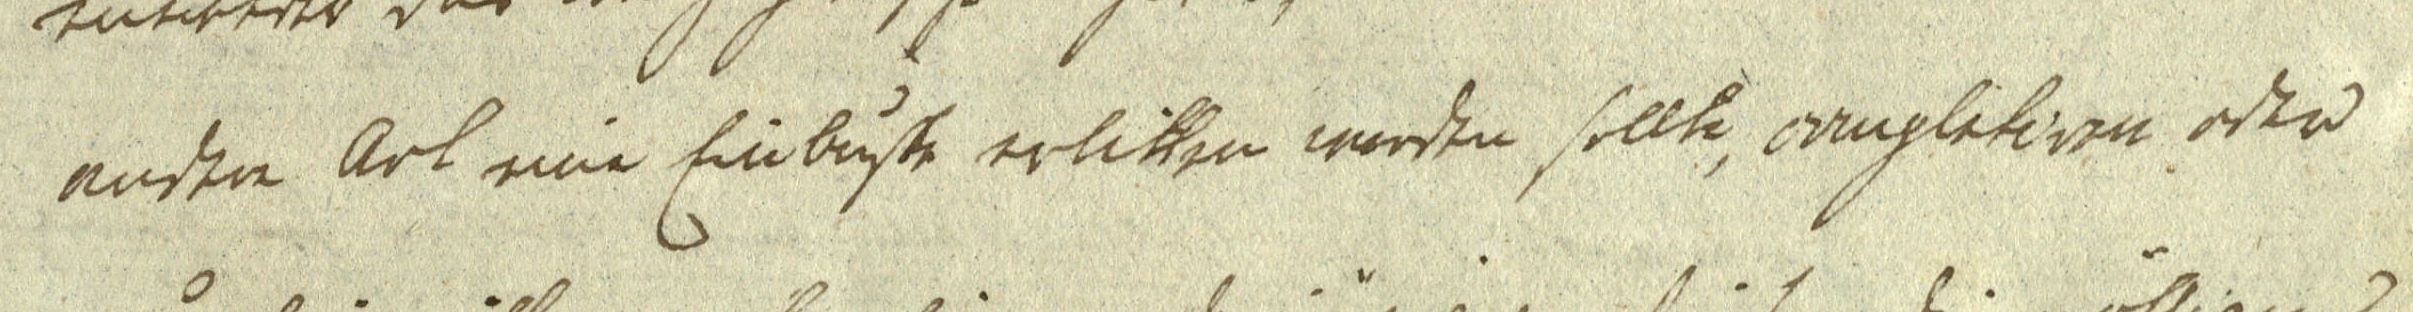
andere Art eine Einbusse erlitten werden sollte, completiren oder
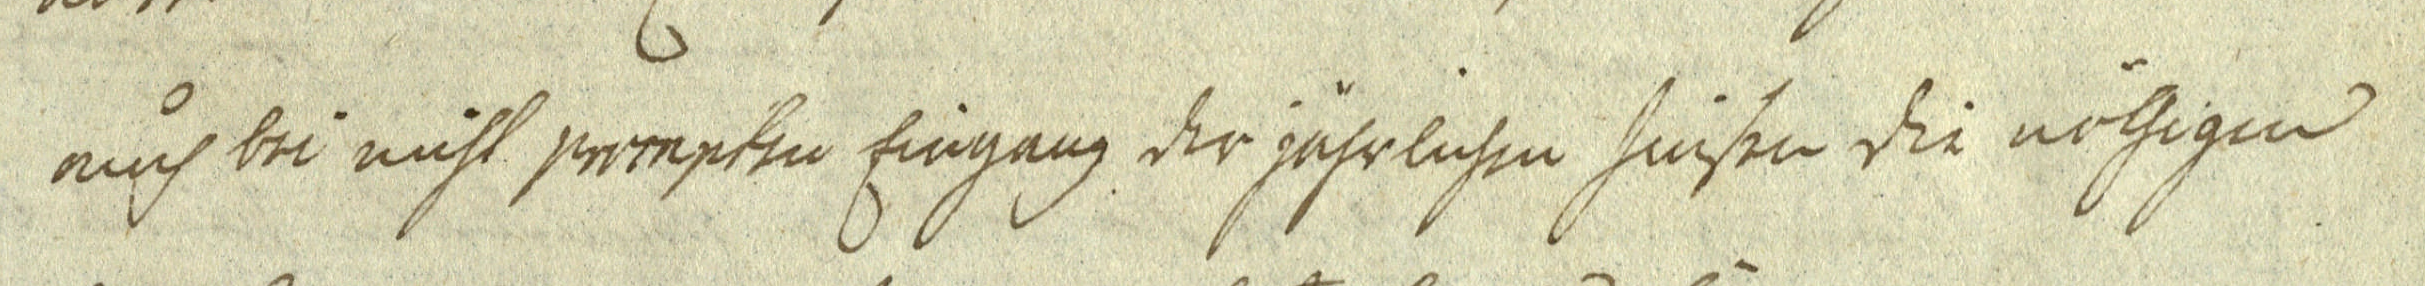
auch bei nicht prompten Eingang der jährlichen Zinsen die nöthigen
